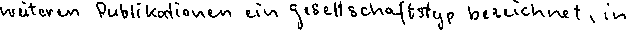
weiteren Publikationen ein Gesellschaftstyp bezeichnet, in
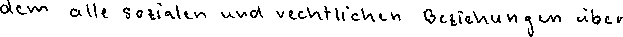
dem alle sozialen und rechtlichen Beziehungen über
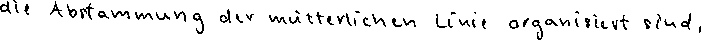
die Abstammung der mütterlichen Linie organisiert sind,
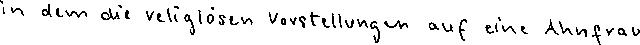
in dem die religiösen Vorstellungen auf eine
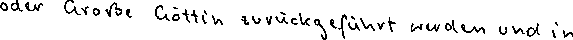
oder Große Göttin zurückgeführt werden und in
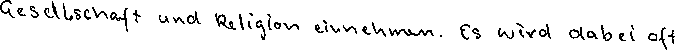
Gesellschaft und Religion einnehmen. Es wird dabei oft
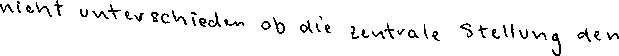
nicht unterschieden, ob die zentrale Stellung den
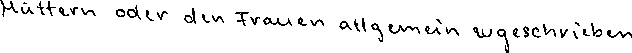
Müttern oder den Frauen allgemein zugeschrieben
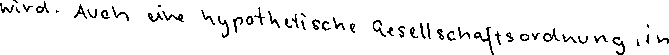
wird. Auch eine hypothetische Gesellschaftsordnung, in
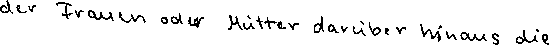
der Frauen oder Mütter darüber hinaus die
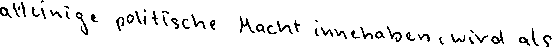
alleinige politische Macht innehaben, wird als
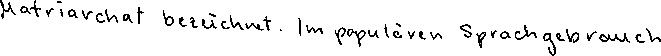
Matriarchat bezeichnet.Im populären Sprachgebrauch
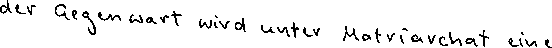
der Gegenwart wird unter Matriarchat eine
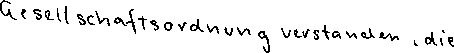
Gesellschaftsordnung verstanden, die
